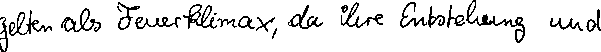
gelten als Feuerklimax, da ihre Entstehung und
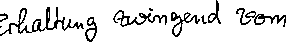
Erhaltung zwingend vom
